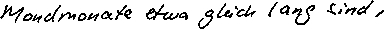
Mondmonate etwa gleich lang sind,
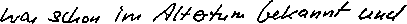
war schon im Altertum bekannt und
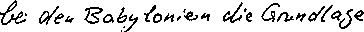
bei den Babyloniern die Grundlage
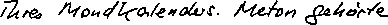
ihres Mondkalenders. Meton gehörte
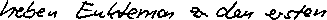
neben Euktemon zu den ersten
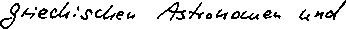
griechischen Astronomen und
